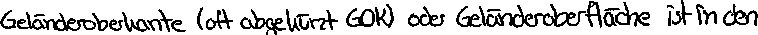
Geländeoberkante (oft abgekürzt GOK) oder Geländeoberfläche ist in den
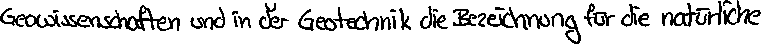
Geowissenschaften und in der Geotechnik die Bezeichnung für die natürliche
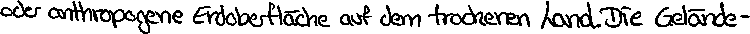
oder anthropogene Erdoberfläche auf dem trockenen Land. Die Gelän-
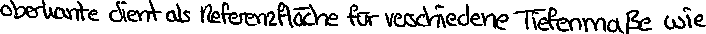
deoberkante dient als Referenzfläche für verschiedene Tiefenmaße wie
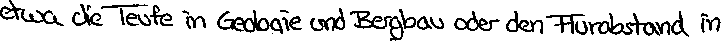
etwa die Teufe in Geologie und Bergbau oder den Flurabstand in
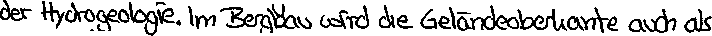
der Hydrogeologie. Im Bergbau wird die Geländeoberkante auch als
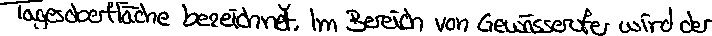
Tagesoberfläche bezeichnet. Im Bereich von Gewässerufern wird der
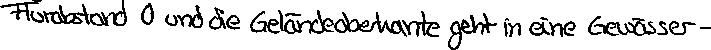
Flurabstand 0 und die Geländeoberkante geht in eine Gewässer-
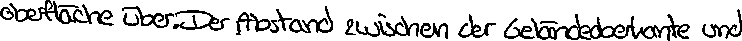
oberfläche über. Der Abstand zwischen der Geländeoberkante und
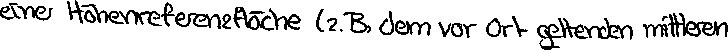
einer Höhenreferenzfläche (z. B. dem vor Ort geltenden mittleren
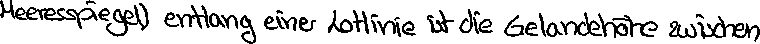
Meeresspiegel) entlang einer Lotlinie ist die Geländehöhe zwischen
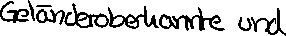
Geländeoberkante und
